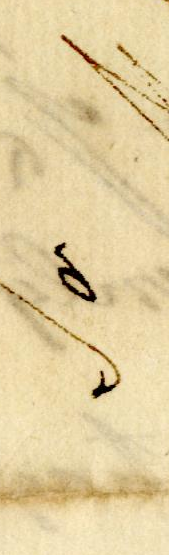To
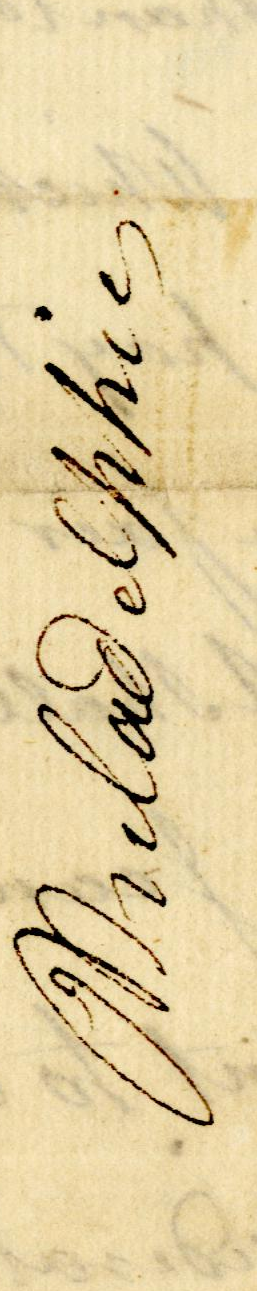Philadelphia
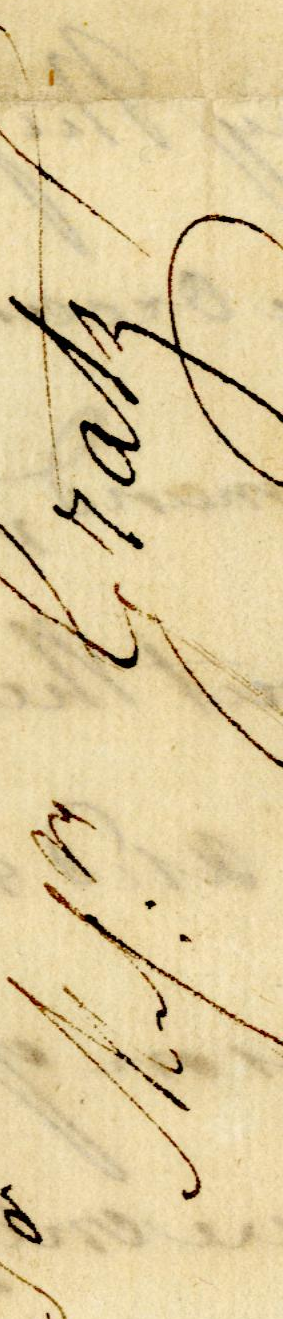Mess^rs Gratz
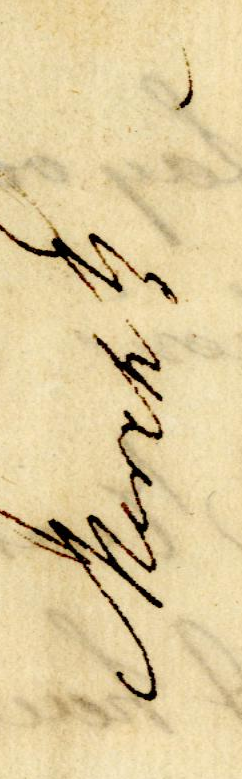Merch^ts
